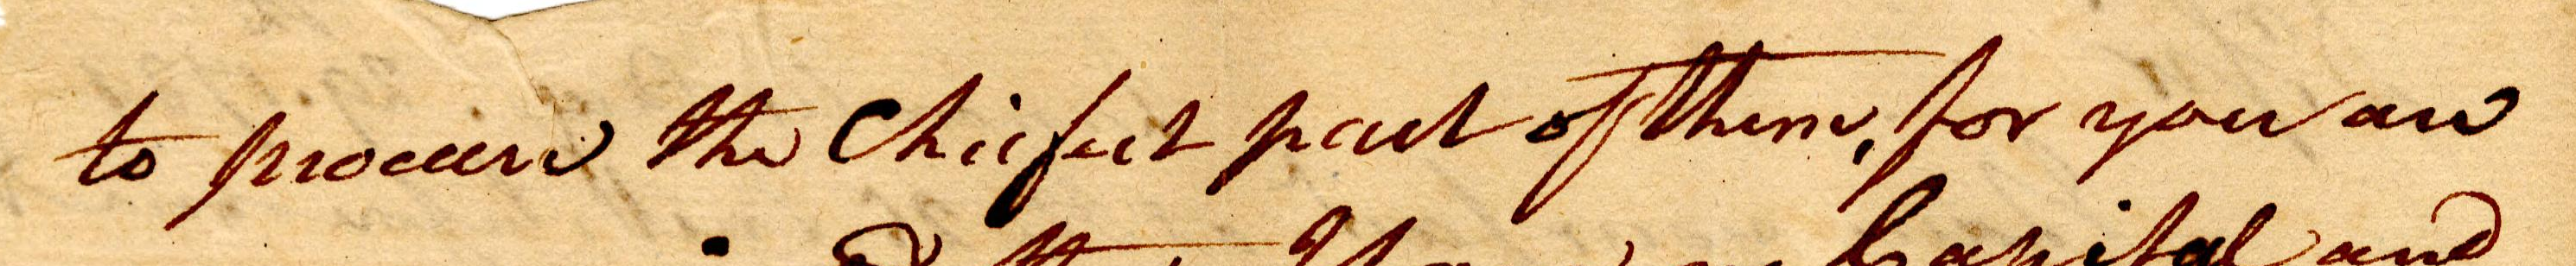to procure the Chiefest part of them, for you are
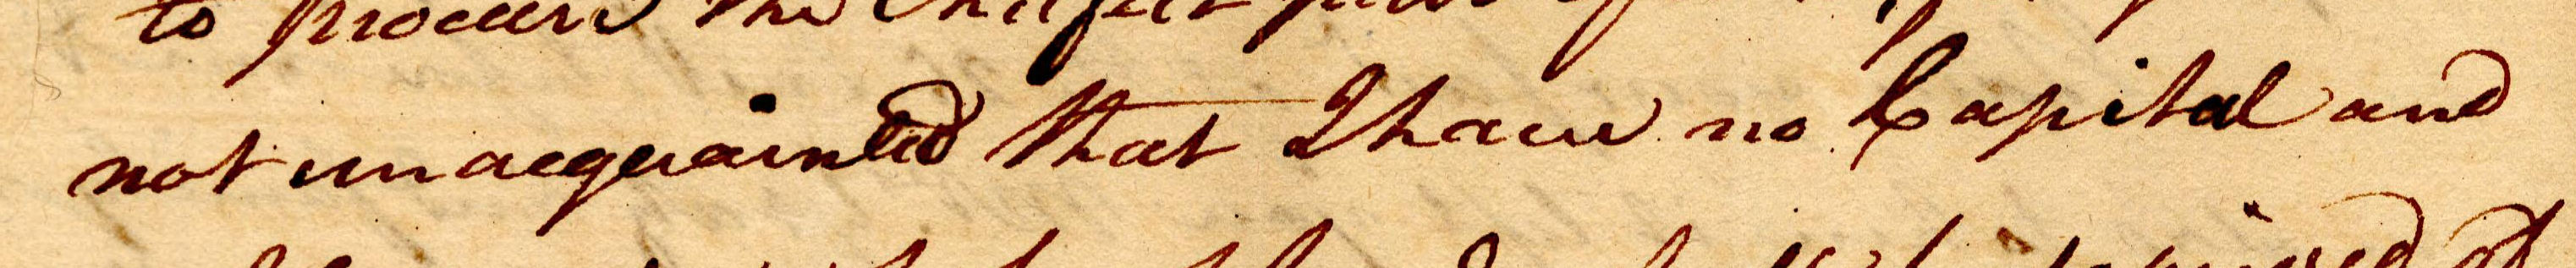not unacquainted that I have no capital and
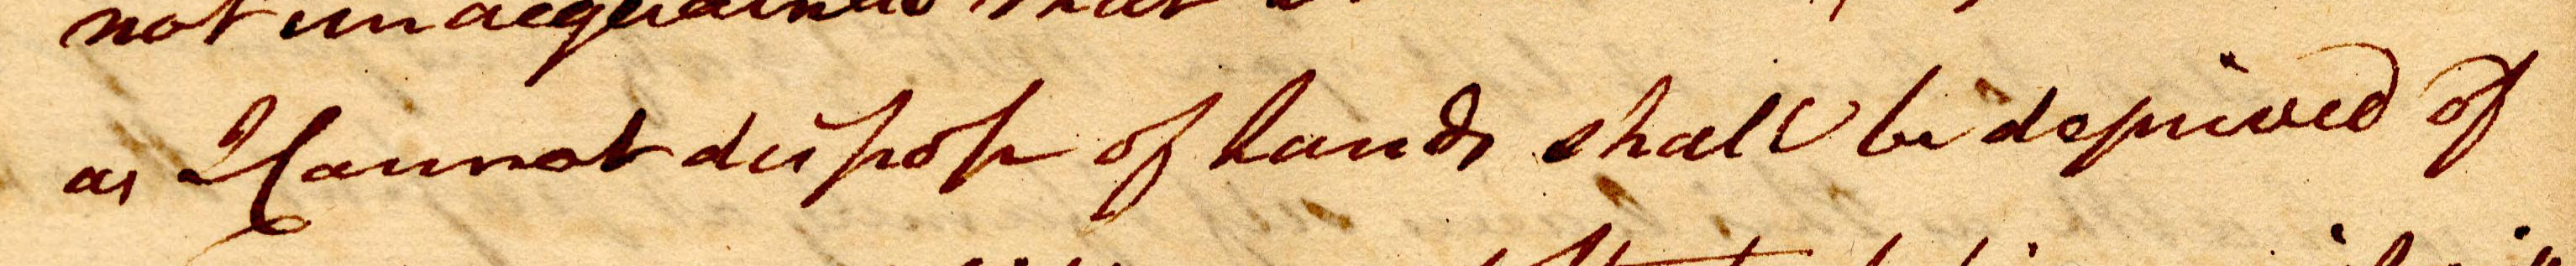as I Cannot dispose of Lands shall be deprived of
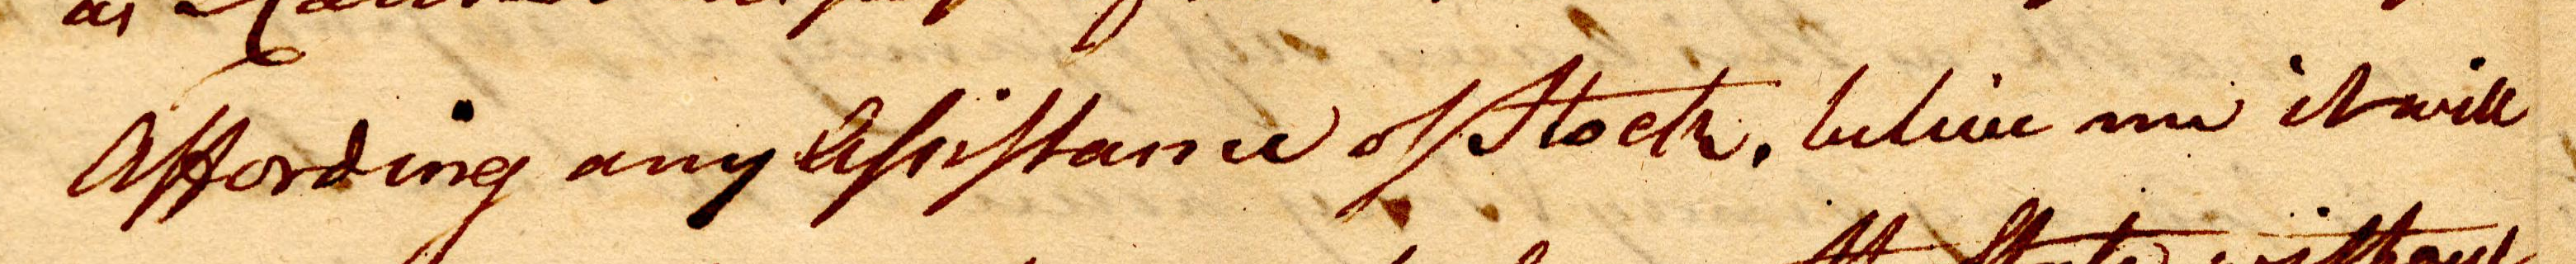Affording any Assistance of Stock, believe me it will
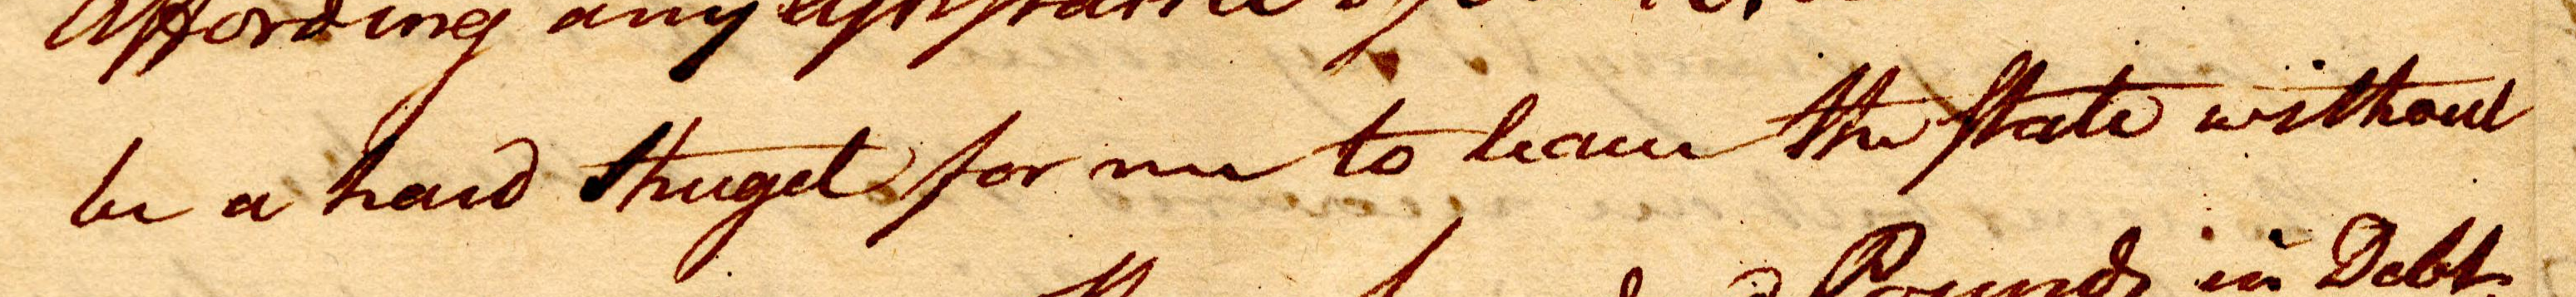be a hard strugel for me to leave the state without
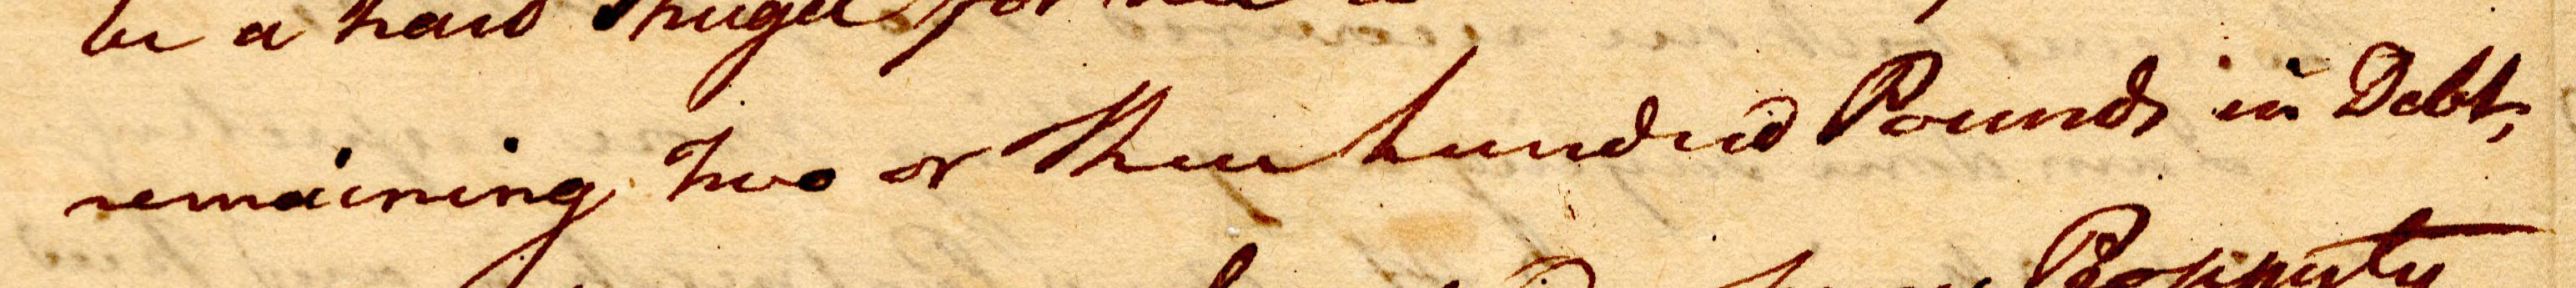remaining Two or three hundred Pounds in Debt
